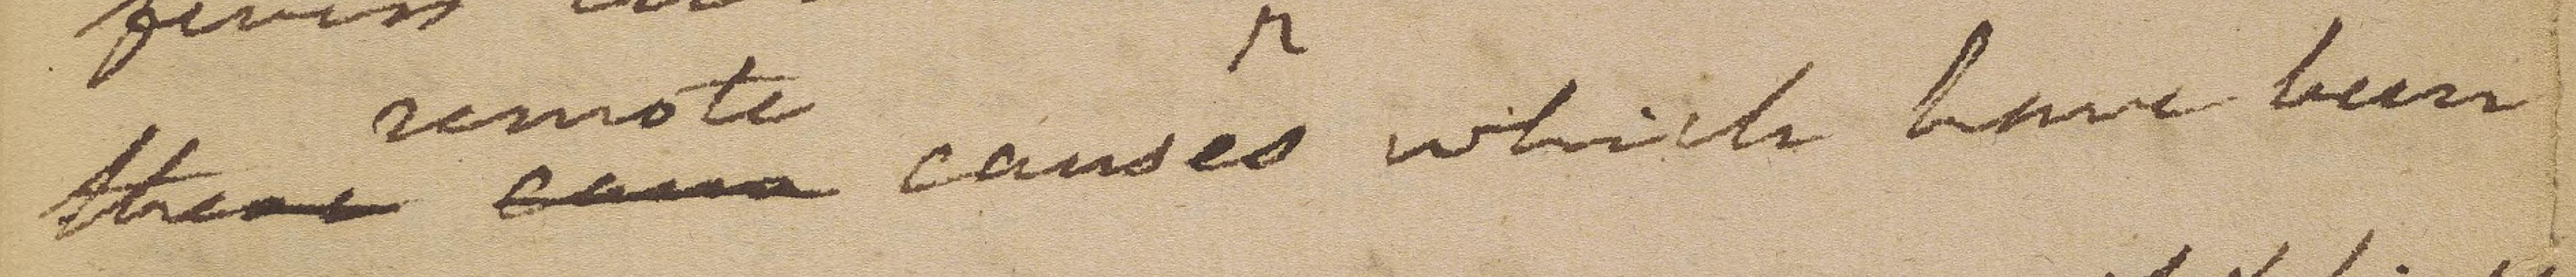the[se] [caus] which have been
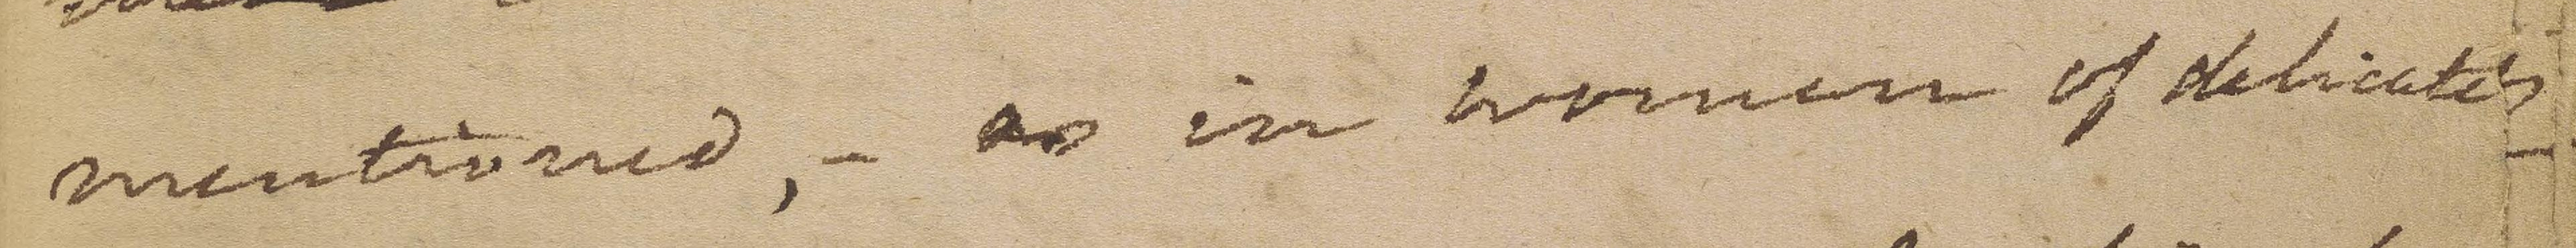mentioned,- as in women of delicate
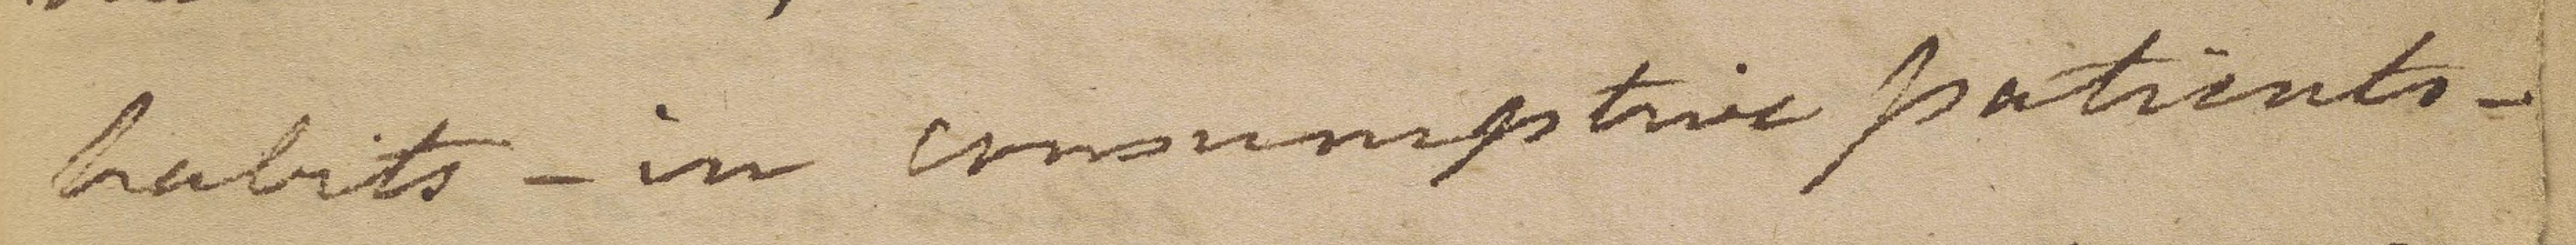habits, in consumptive patients,
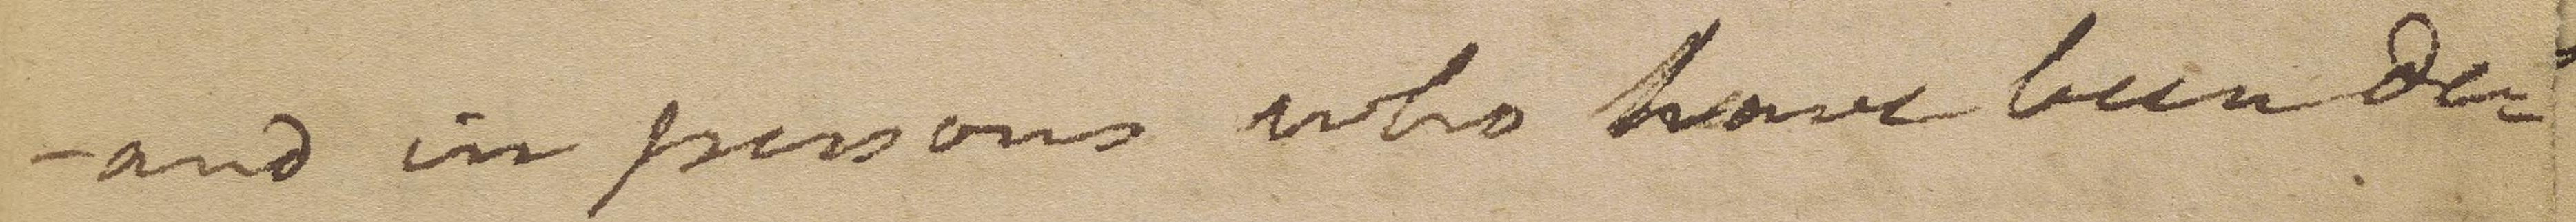- and in persons who have been de-
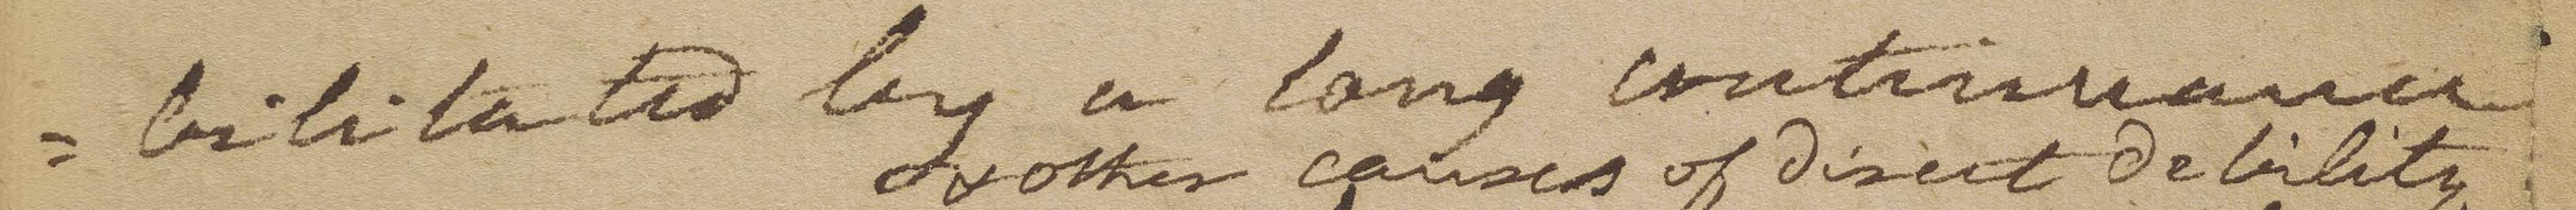-bilitated by a long continuance
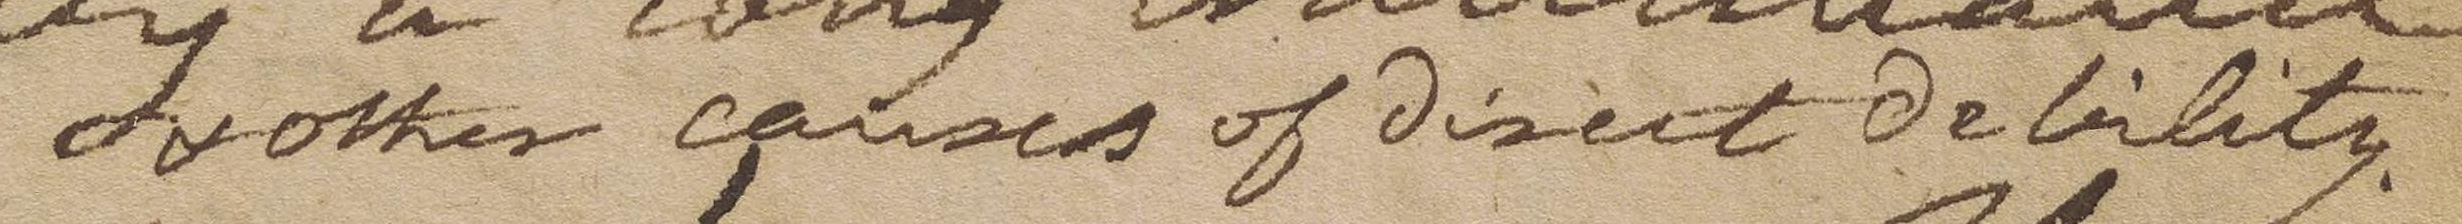& other causes of direct debility.
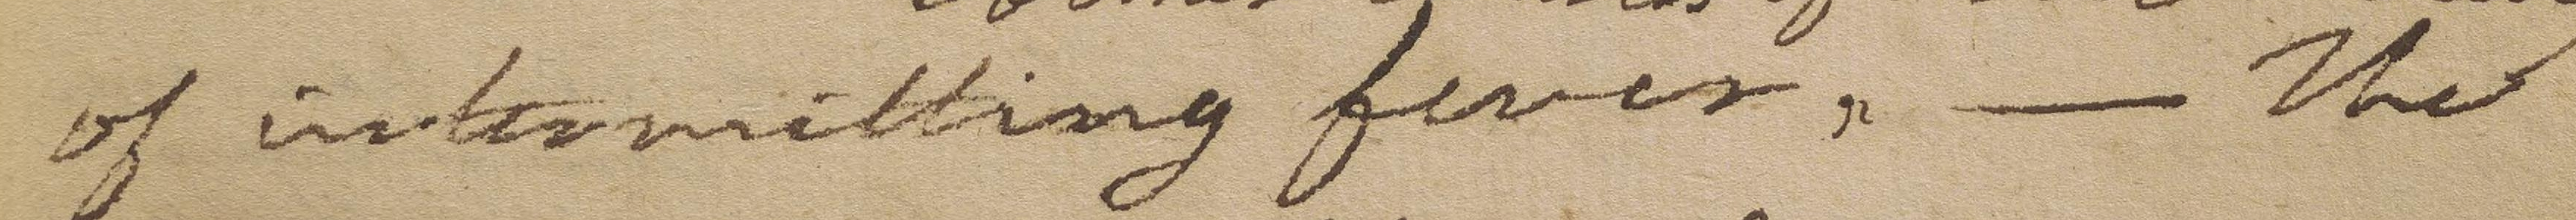of intermitting fever.- The
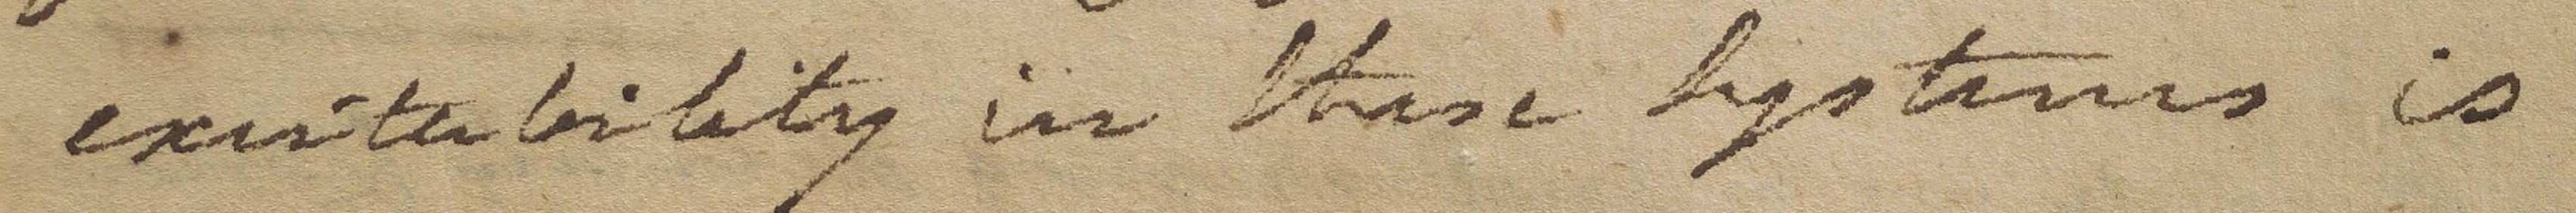excitability in these systems is
